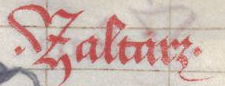.Zaltarz.
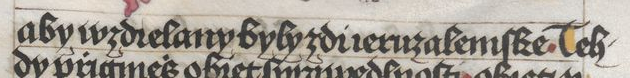aby wzdielany byly zdi ieruzalemſke.Teh¬
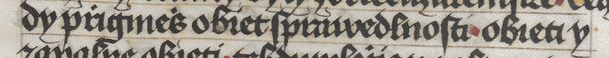dy pṙigmeṡ obiet ſprawedlnoſti.obieti y
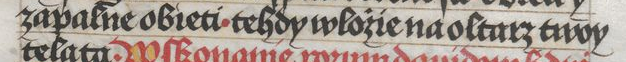zapalne obieti.tehdy wlożíe na oltarz twoy
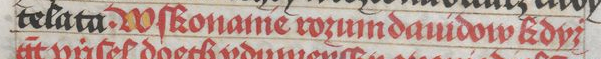telata.Wſkonaníe rozum dauidow když
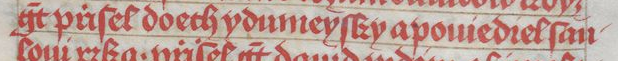ḡt pṙiẛel doeth ydumeyſky apouiediel ſau¬
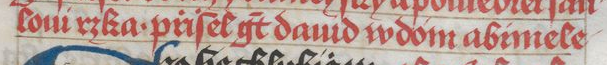loui rzka.pṙiẛel ḡt dauid w dóm abimele¬
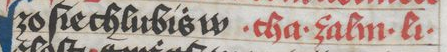zo ſie chlubíṡ w.cha.żalm.li.
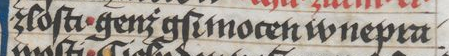zloſti.genž gſi mocen w nepra¬
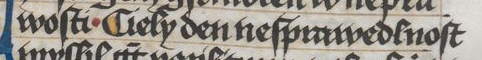woſti.Ciely den neſprawedlnoſt
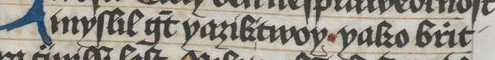myſlil ḡt yaziktwoy.yako bṙit¬
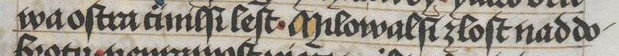wa oſtra ċinilſi leſt. Milowalſi zloſt nad do¬
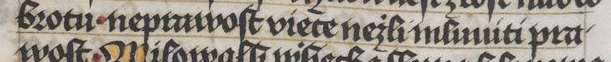brotu.neprwoſt viece neżli mluuítí pra¬
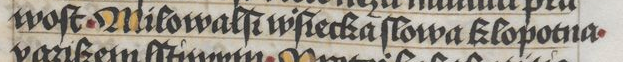woſt.Milowalſi wẛiecka ſlowa klopotna.
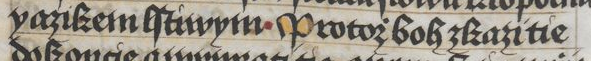yazikem lſtiwym.Protoż boh zkazí tie
